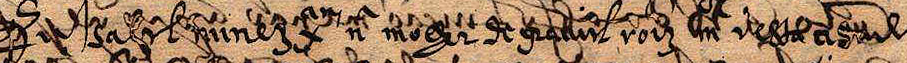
Eu Isabel nunez xam na molher de grauiel roiz mor nesta cidade
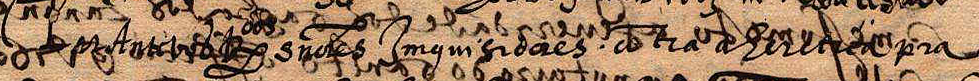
PerAnte vos Rꝭdos snōres Jmquisidores cōtra a heretica pra
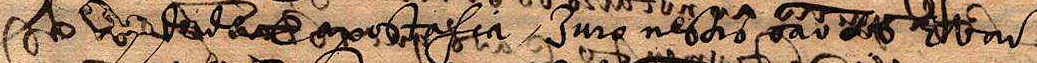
vjdade e apostasia / Juro nestes sãotos evan
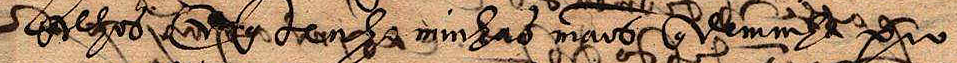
gelhos ē q̄ tenho minhas mãos q̄ de minha pro
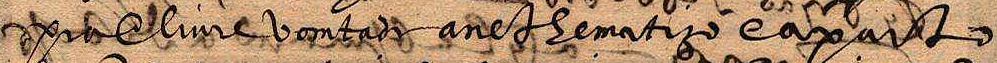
pria e liure vomtade anethematizo e aparto
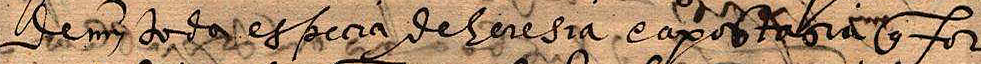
de mj̄ toda especia de heresia e apostasia q̄ for
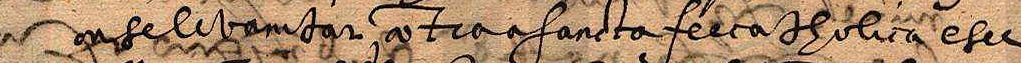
ou se levamtar cōtra a sancta fee catholica e see
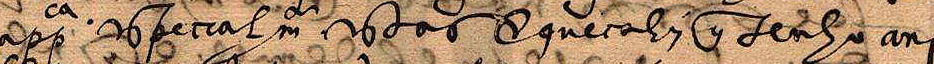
appca. especialmte estas ē que cahy q̄ tenho con
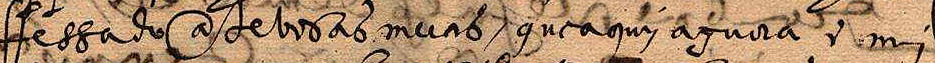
ffessado āte vosas merces / que aquy aguora ē mj
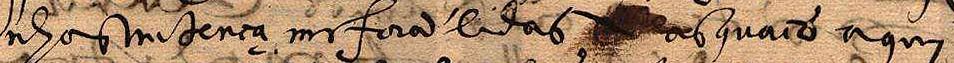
nha semtença me forā lidas _ as quaes aquj
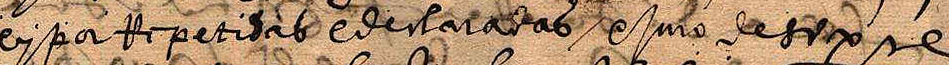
ej por Repetidas e declaradas / e Juro de sēpre
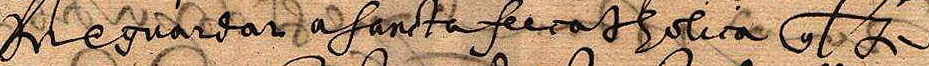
ter e guardar a sancta fee catholica q̄ tē
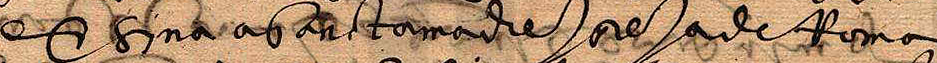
e ēsjna a sancta madre JgreJa de Roma
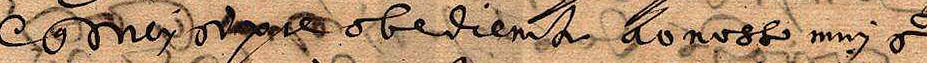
e q̄ serey sēpre obediemte ao nosso muy sto
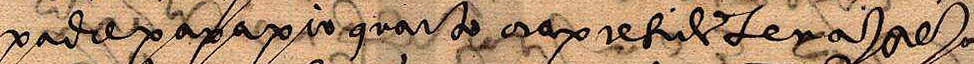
padre papa pio quarto ora presidēte na JgreJa
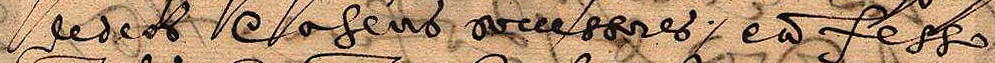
de deos e a seus soccessores. / e cōfesso
